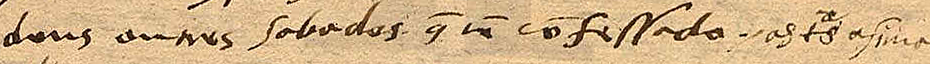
dous ou tres sabados q̄ tē cōfessado / as tas asima
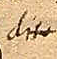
ditas.
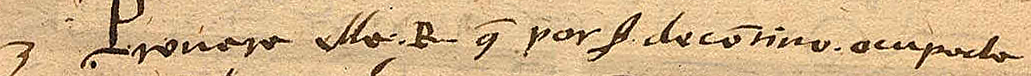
3 Prouara ella .R. q̄ por ꞩ de cōtino ocupada
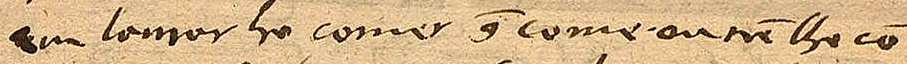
em laurar ho comer q̄ come outrē lhe cō
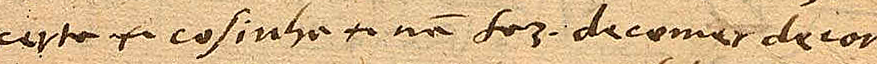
certa e cosinha e nā faz. de comer de car
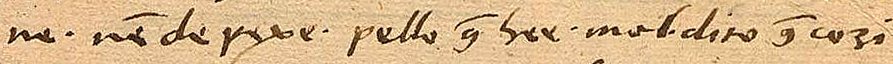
ne. nē de pexe. pello q̄ hee mal dito q̄ cozi
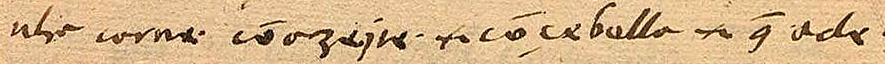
nha carne cō azejte. e cō çebolla e q̄ a de
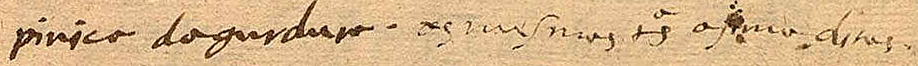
pinica da gurdura. as mesmas tas asima ditas.
